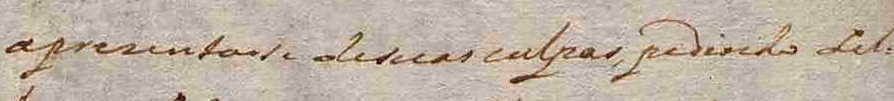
aprezentarse de suas culpas, pedindo del
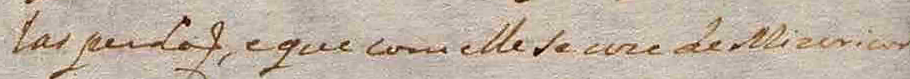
las perdaõ, e que com elle se uze de Mizericor
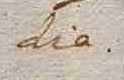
dia.
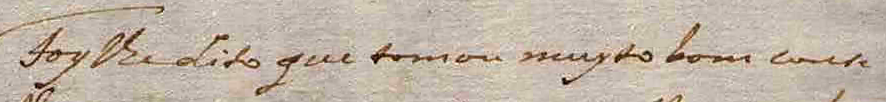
Foyl he dito que tomou muyto bom conse
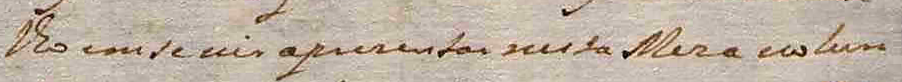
lho em se uir aprezentar nesta Meza uolun
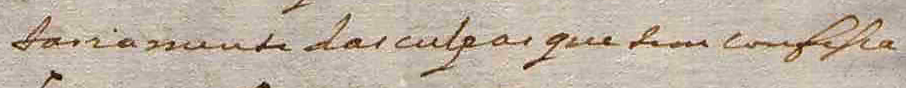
tariamente das culpas que tem confessa
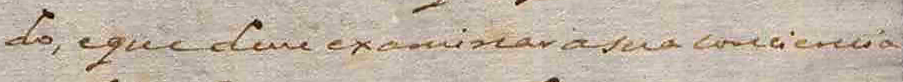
do, e que deue examinar a sua conciencia
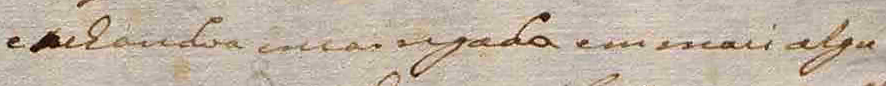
e achandoa encarregada em mais algu
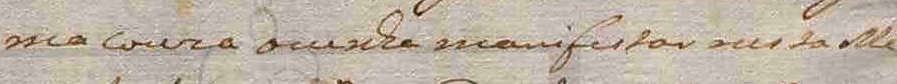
ma couza o uinha manifestar nesta Me
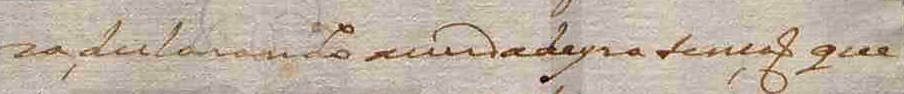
za, declarando a uerdadeyra tençaõ que
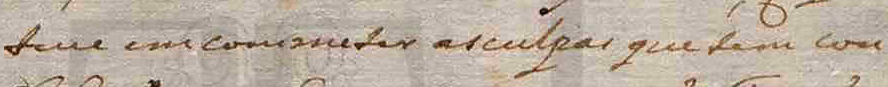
teue em commeter as culpas que tem con
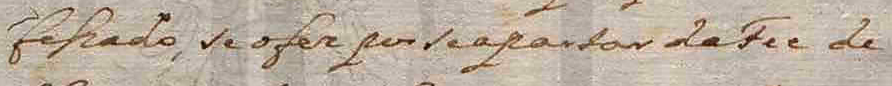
fessado, se o fez por se apartar da Fee de
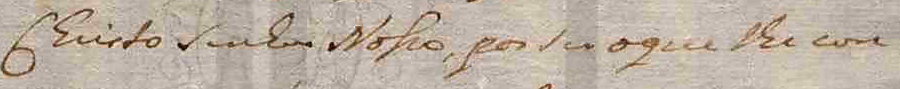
Christo Senhor Nosso, por ser o que lhe com
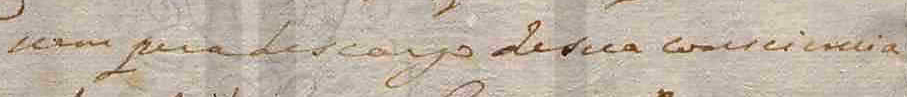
uem pera descargo de sua consciencia
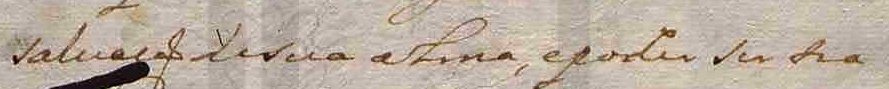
saluaçaõ de sua alma, e poder ser tra
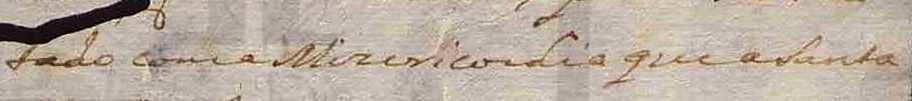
tado com a Mizericordia que a santa
